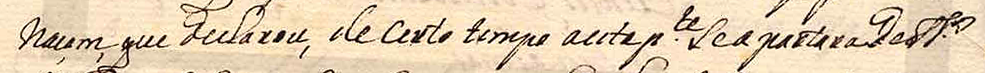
naçam, que declarou, de certo tempo a esta p.te se apartara de N.a
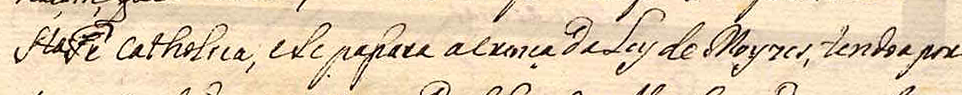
Sta Fé catholica, e se passara a crença da Ley de Moyzes, tendoa por
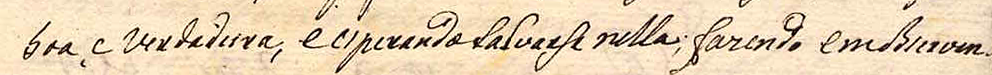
boa, e verdadeira, e esperando salvarse nella; fazendo em observen
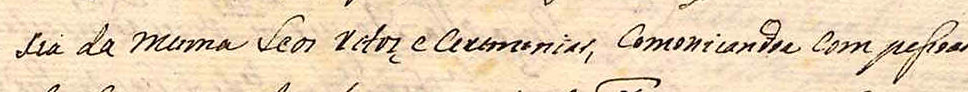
sia da mesma Seos ritos, e ceremonias, comonicandoa com pessoas
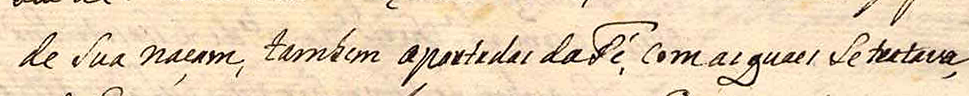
de sua naçam, tambem apartadas da Fé, com as quaes se tratava,
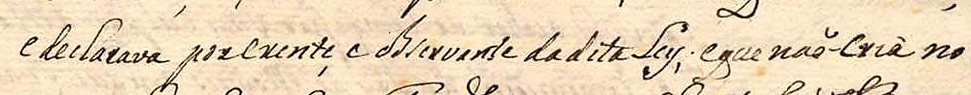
e declarava por crente, e observante da dita Ley; e que naõ cria no
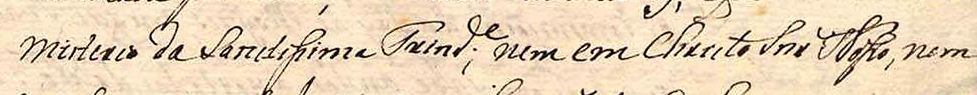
misterio da Sanctissima Trind.e, nem em Christo Snr̄ Nosso, nem
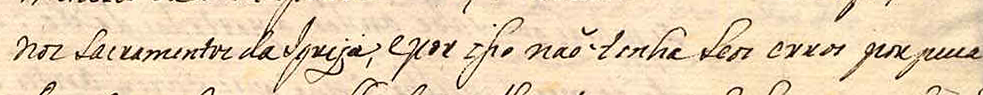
nos Sacramentos da Igreja, e por isso naõ tenha Seos erros por pecca
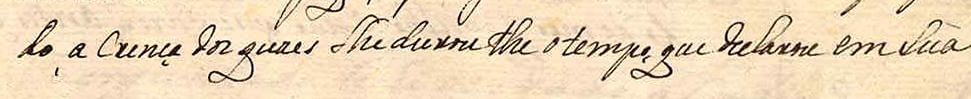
do, a crença dos quaes lhe durou the o tempo, que declarou em Sua
